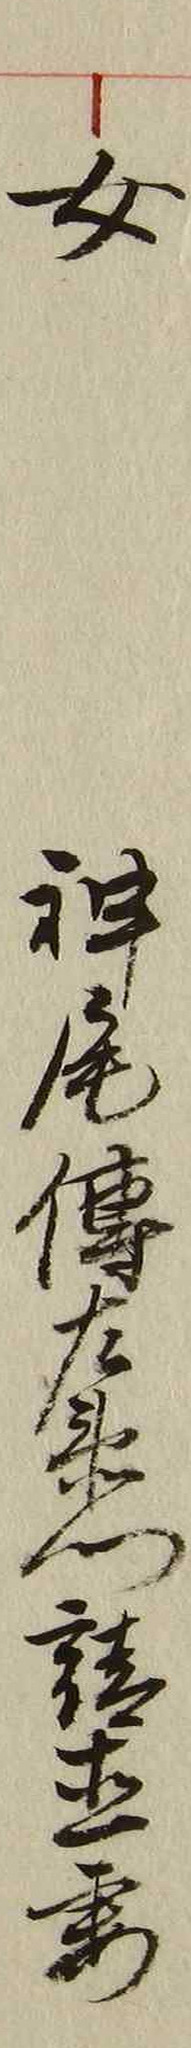女神尾伝左衛門請直妻
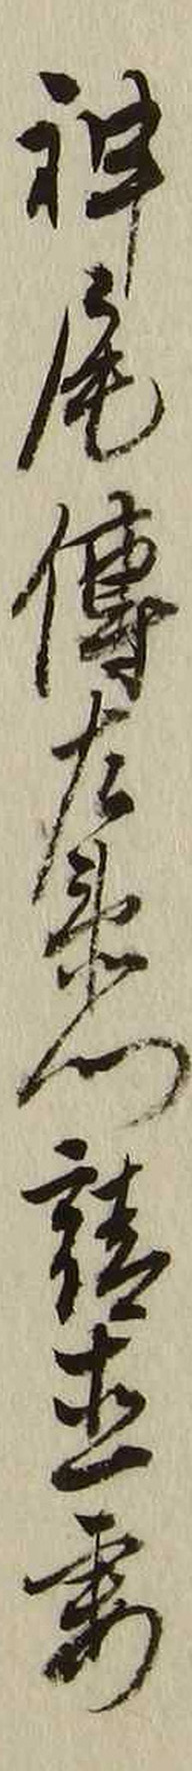女神尾伝左衛門請直妻
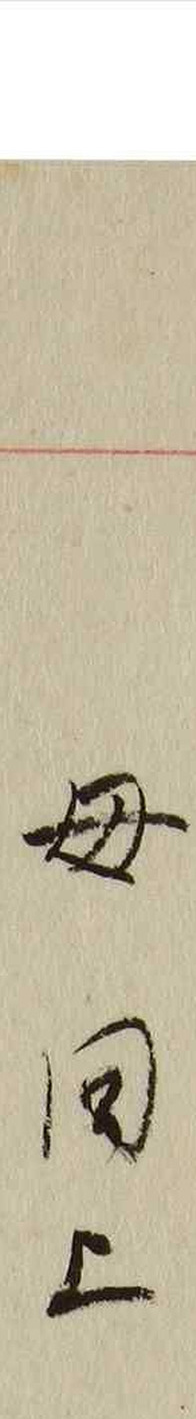母同上
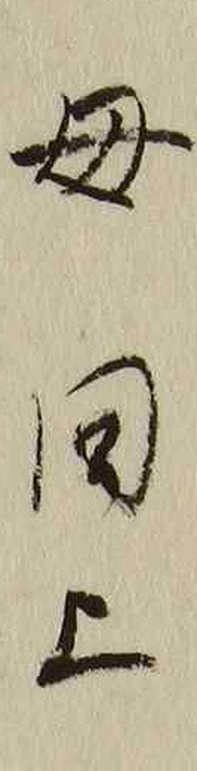母同上
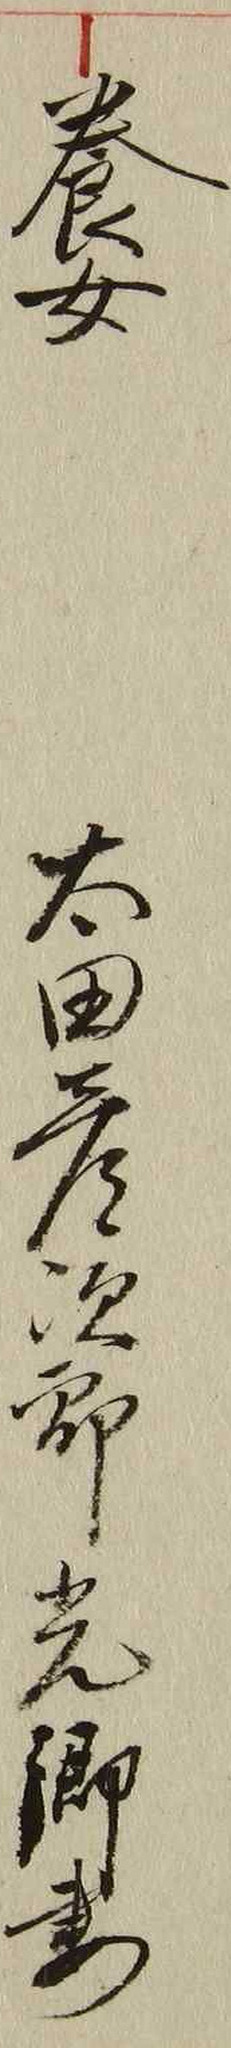養女太田彦次郎光郷妻
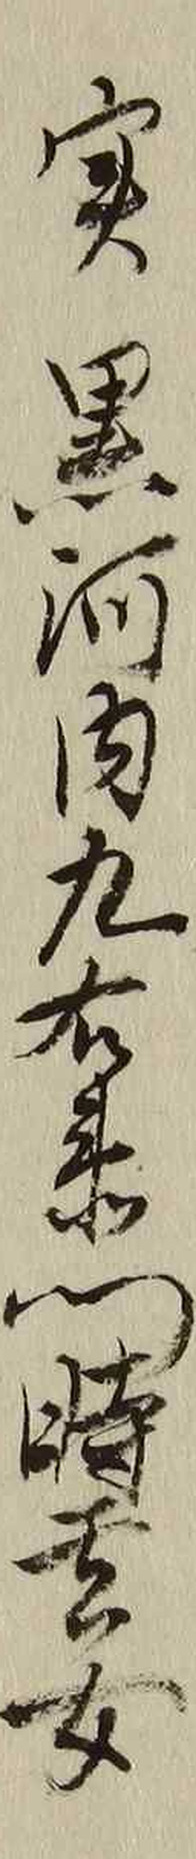実黒河内九右衛門時玄女
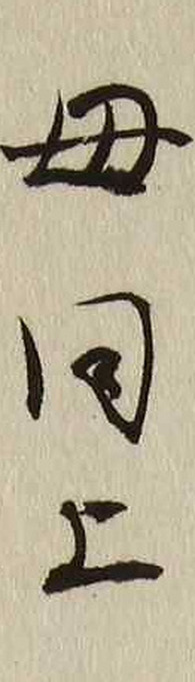母同上
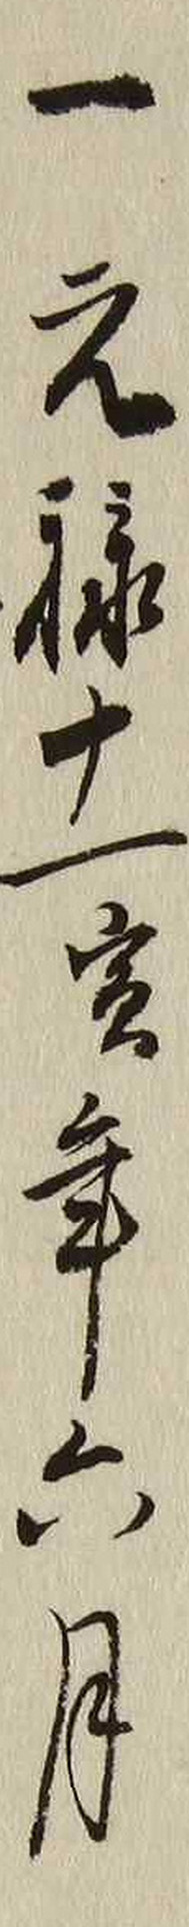一元禄十一寅年六月
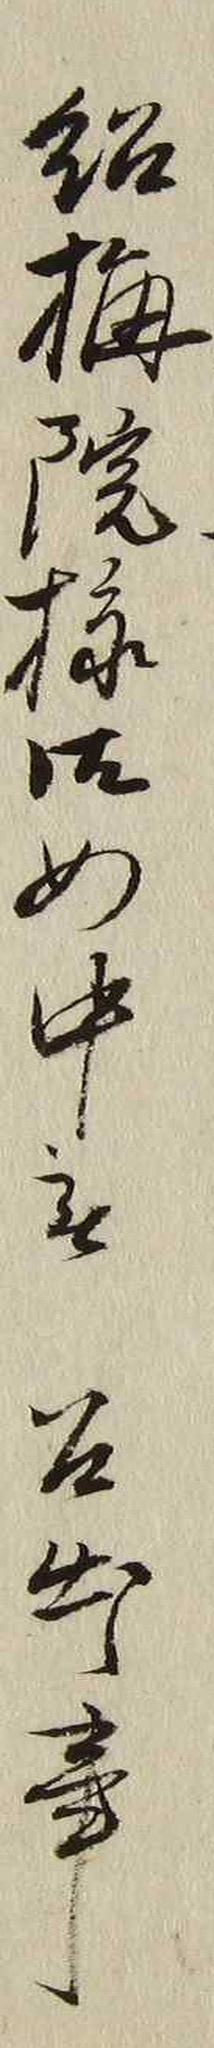紹栴院様御女中被召出候事
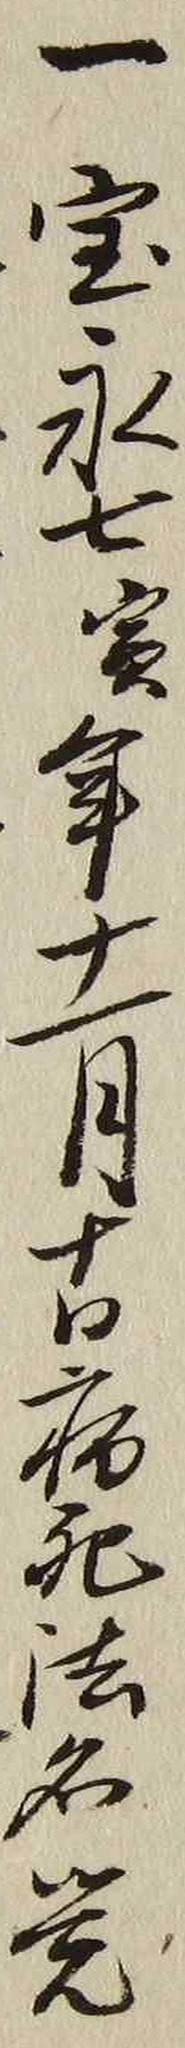一宝永七寅年十一月十日病死法名覚
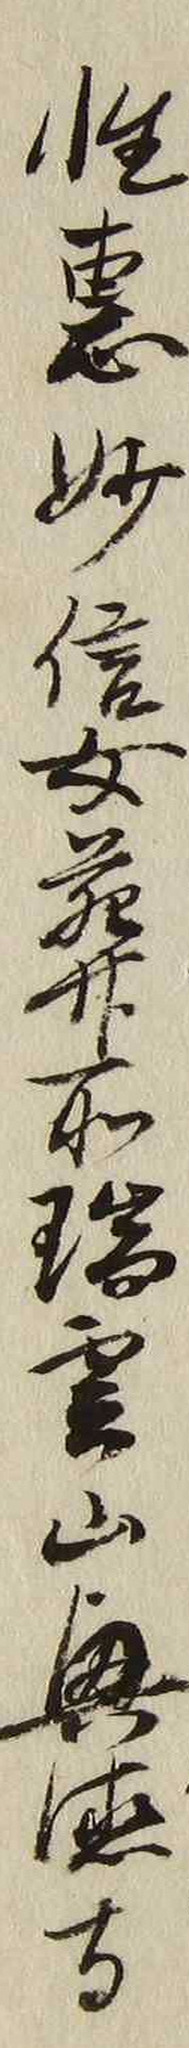性恵妙信女葬所瑞雲山興徳寺
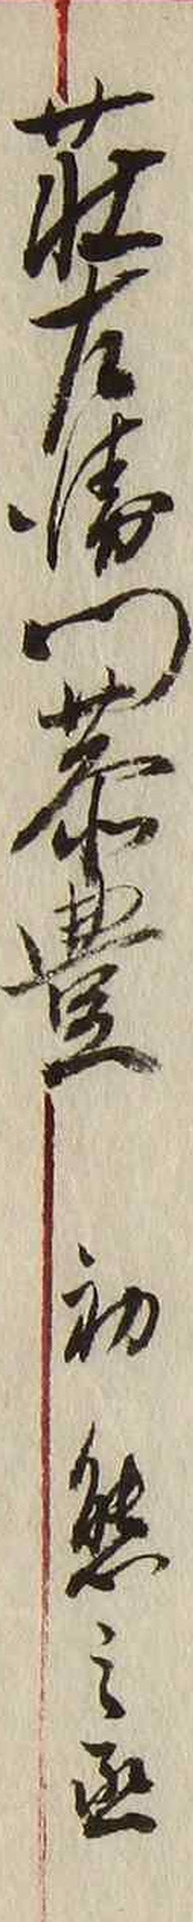荘左衛門恭豊初熊之丞

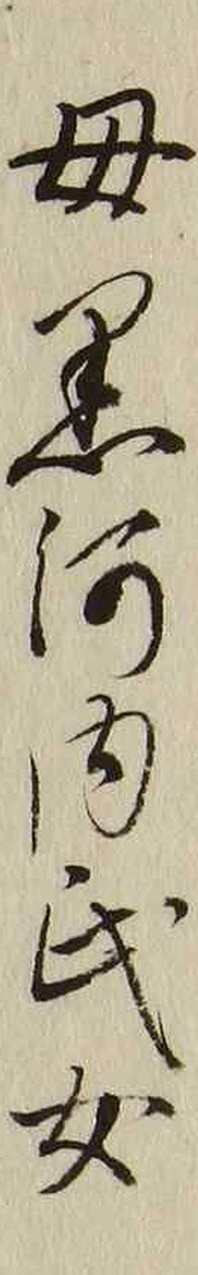母黒河内氏女
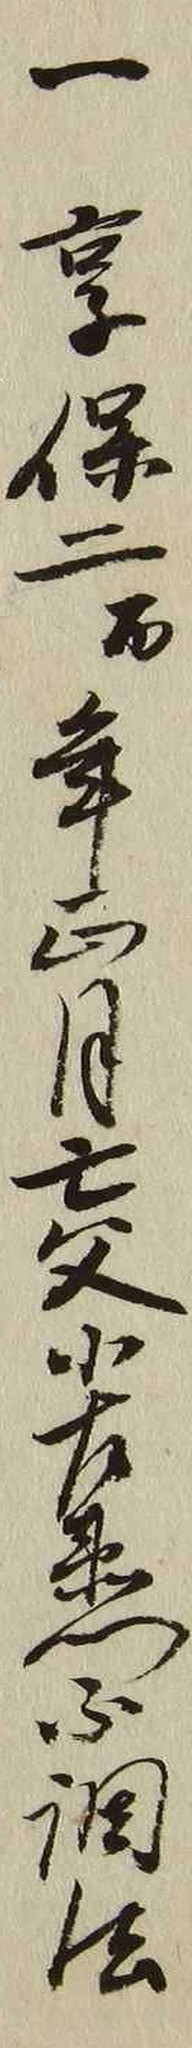一享保二酉年正月亡父小左衛門不調法
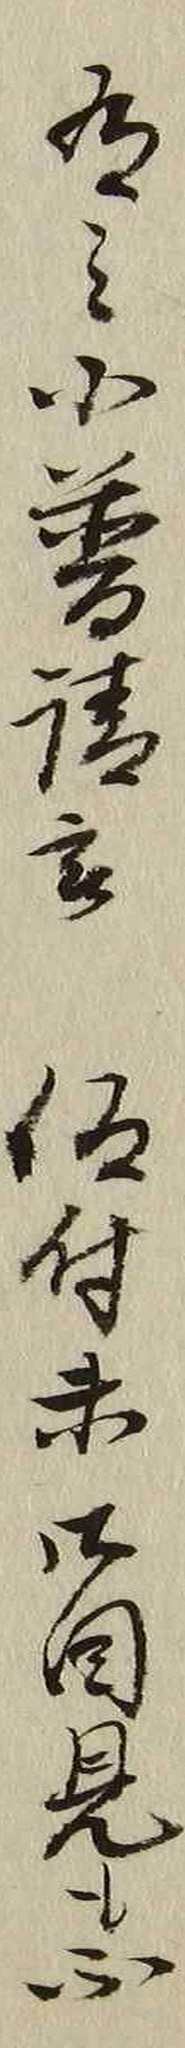有之小普請被仰付未御目見も不
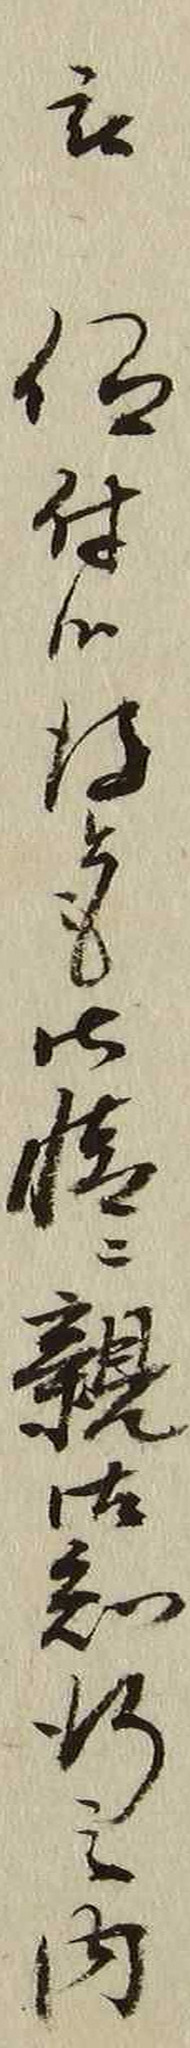被仰付候得とも御情ニ親御知行之内
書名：諸士系譜　巻之352　す之部2
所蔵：会津若松市立会津図書館
